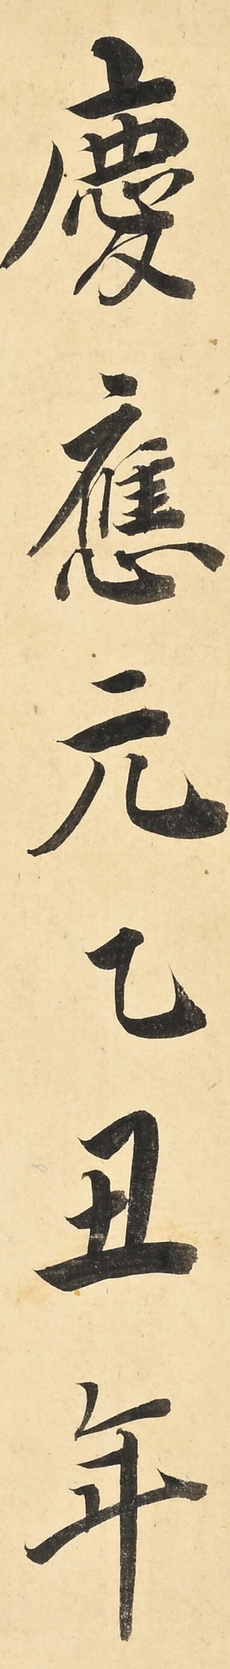慶応元乙丑年
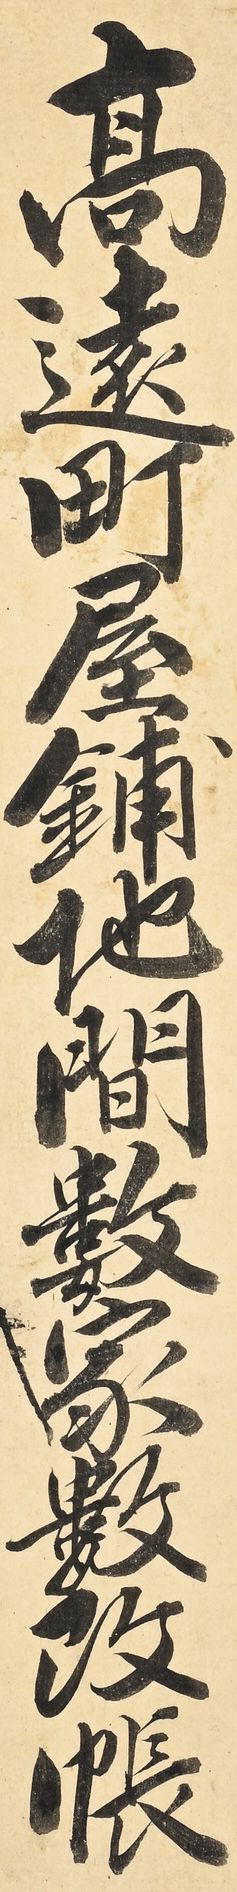高遠町屋敷地間数家数改帳
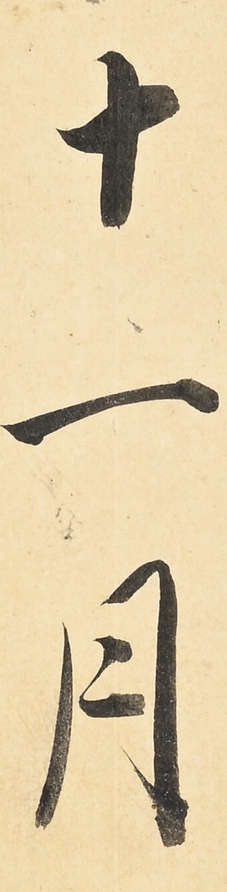十一月

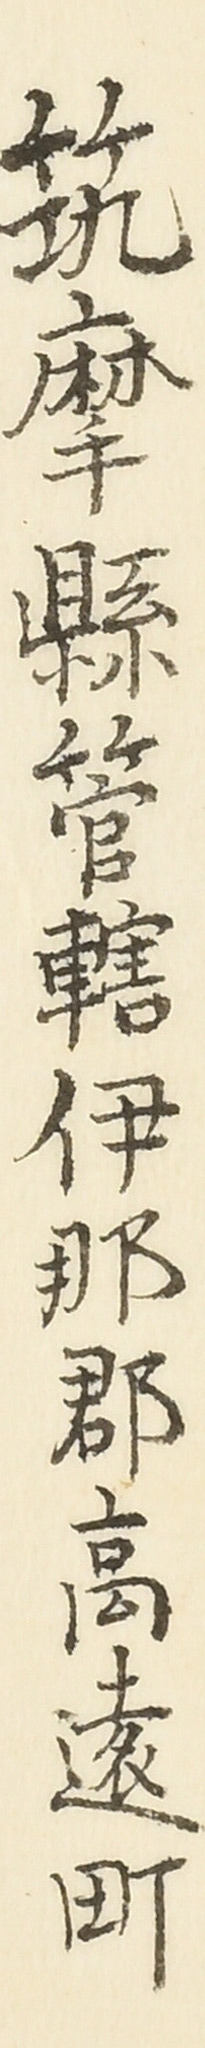筑摩県管轄伊那郡高遠町
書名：高遠町屋鋪地間数家数改帳
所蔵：伊那市立高遠町図書館・合同会社AMANE
